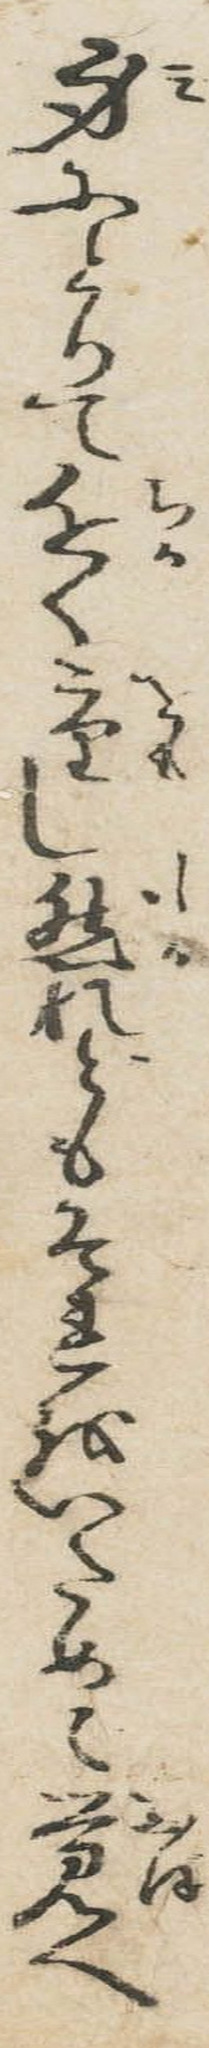身にとりて近く重し然れどもそれをいためて覚へ
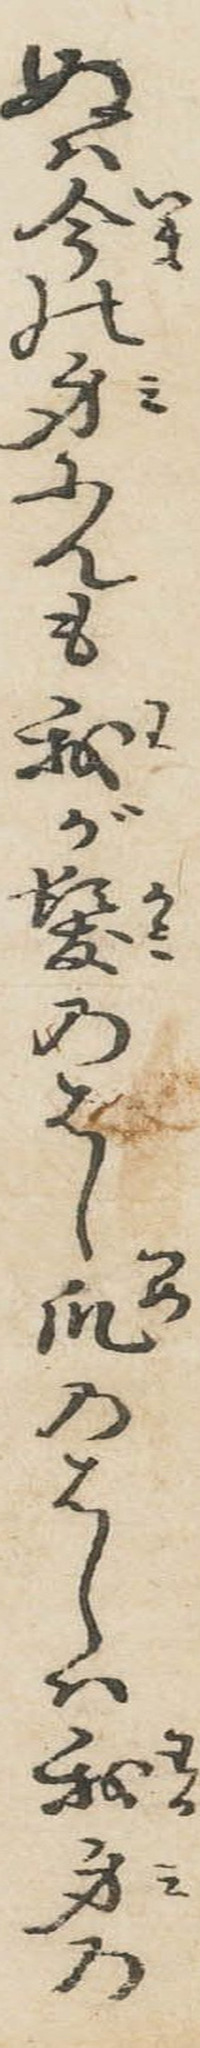ぬは今の身にも我が髪のはし爪のはしは我身の
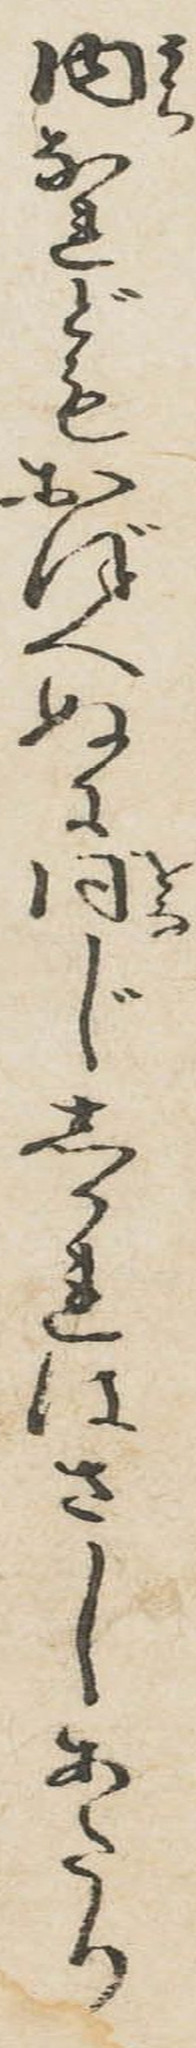内なれどもおぼへぬに同じしかれはさしあたり
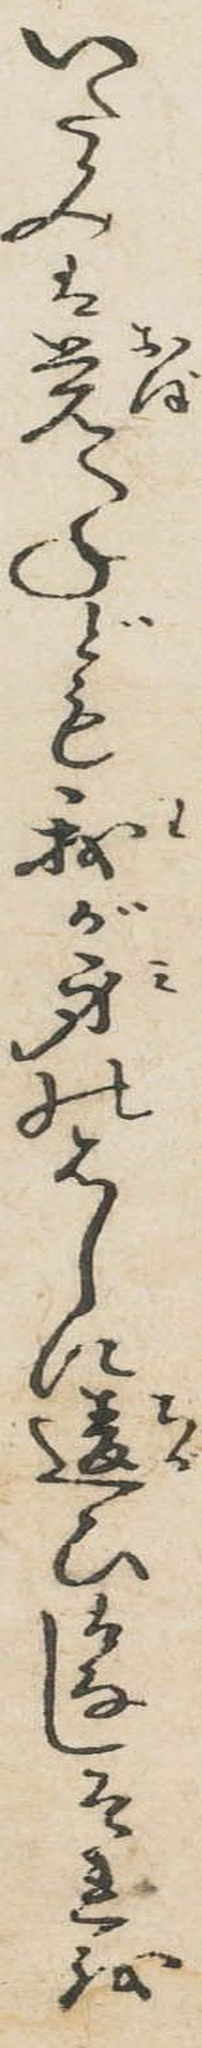いたみは覚へねども我が身のはしに違ひなしそれを
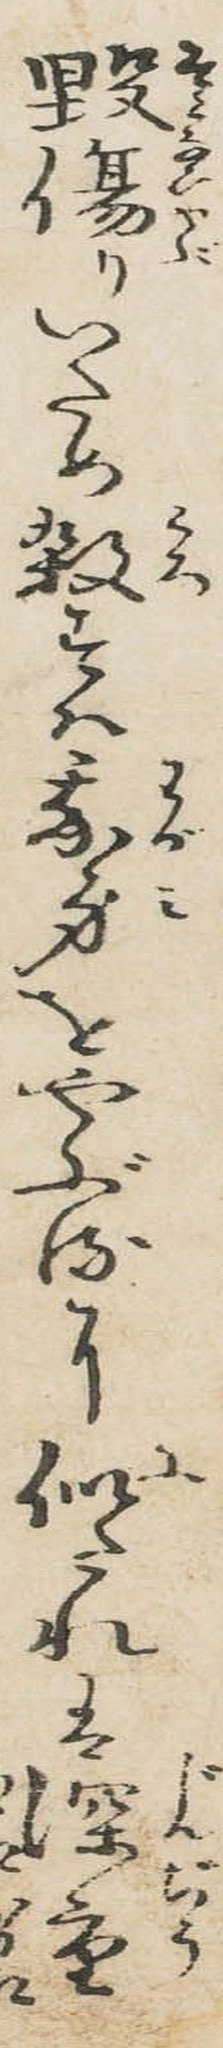毀傷りいため殺すは我身をやぶるに似たれは深重
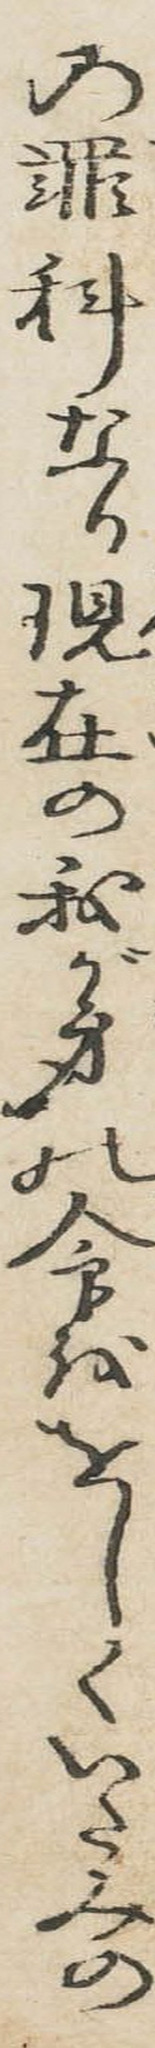の罪科なり現在の我が身の命ををしくいたみの
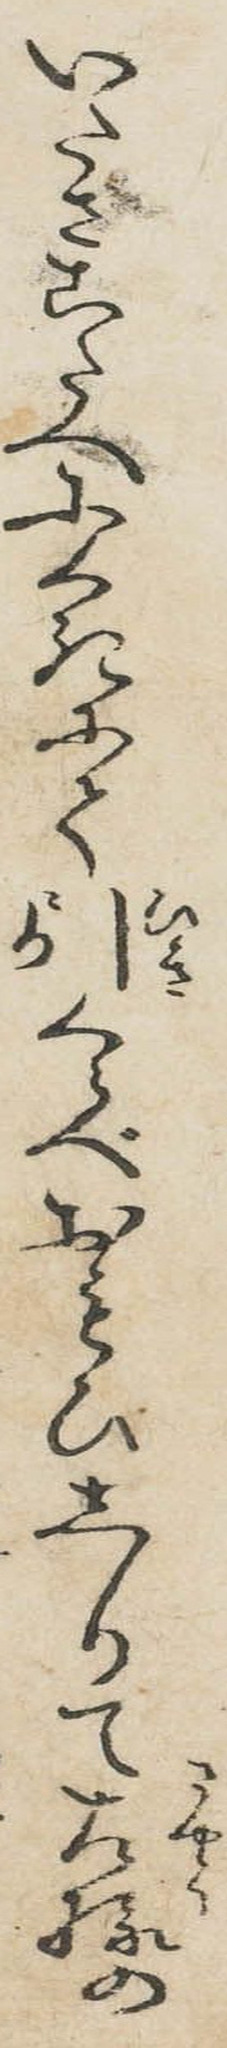いたさこたへにくきにて引くらべおもひしりて左様の
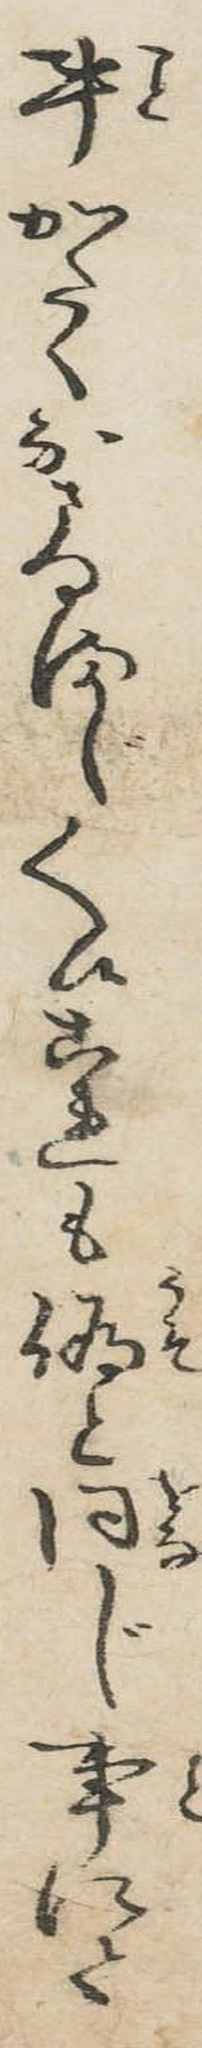事かたくなさるまじく候これも偽と同じ事にて
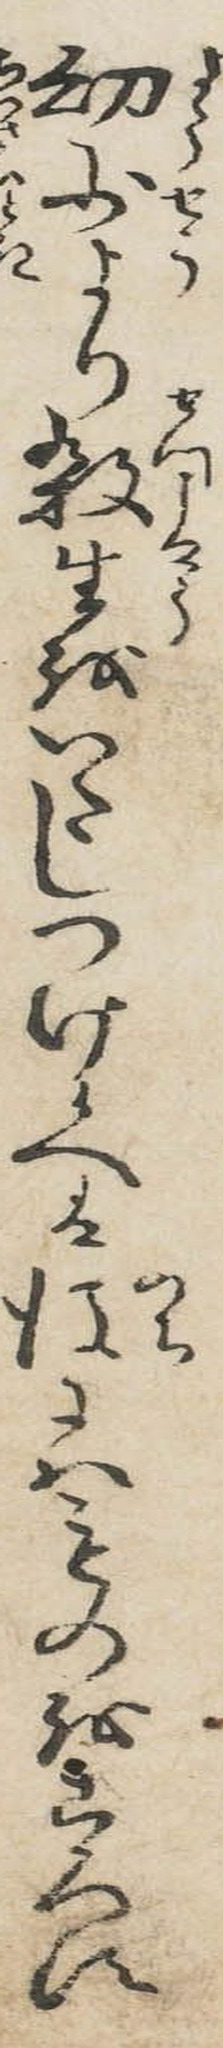幼少より殺生をいたしつけ候へは後にはものをころす
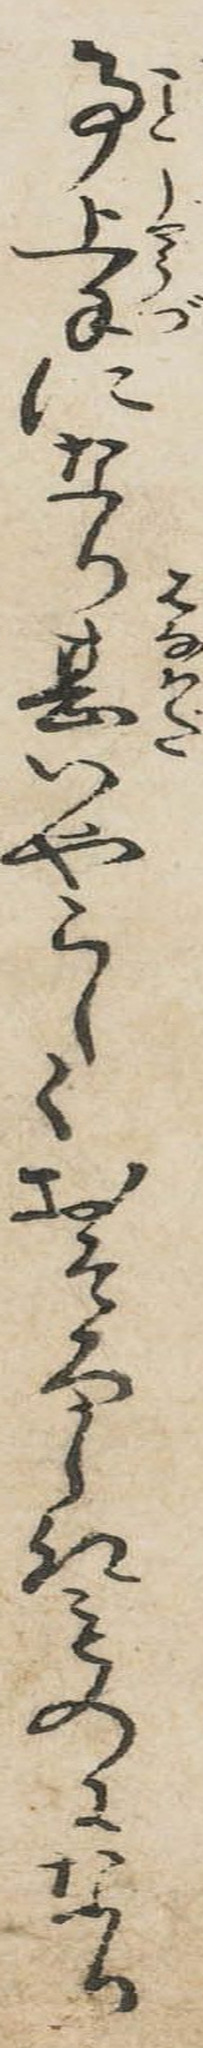事上手になり甚いやらしくおそろしきものになり
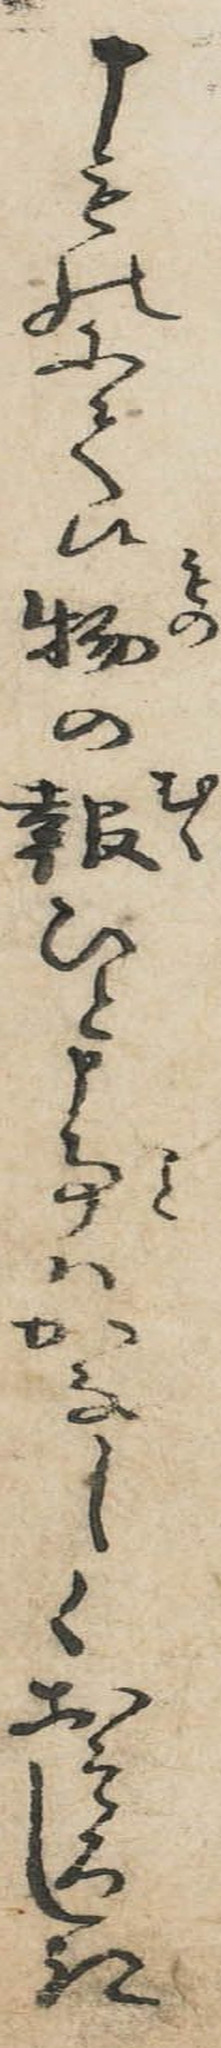申ものにて候物の報ひと申事はかなしくもおそろしき

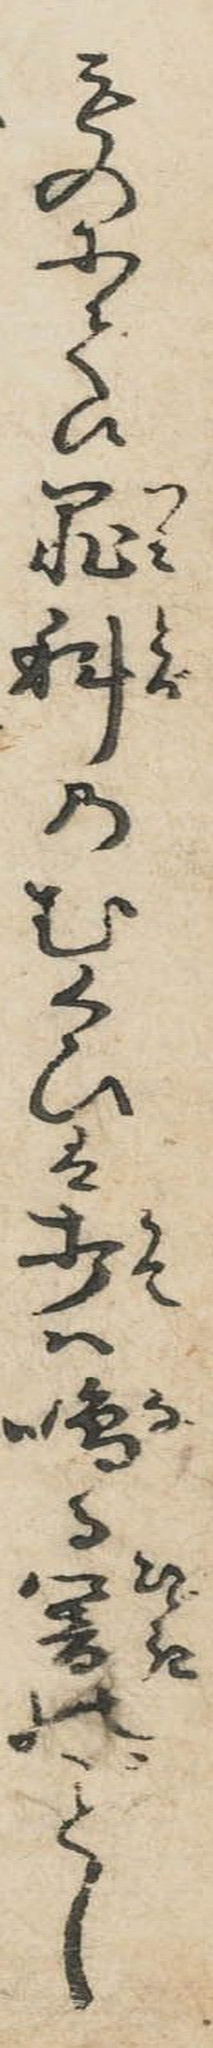ものにて候罪科のむくひは打は鳴る響のごとし
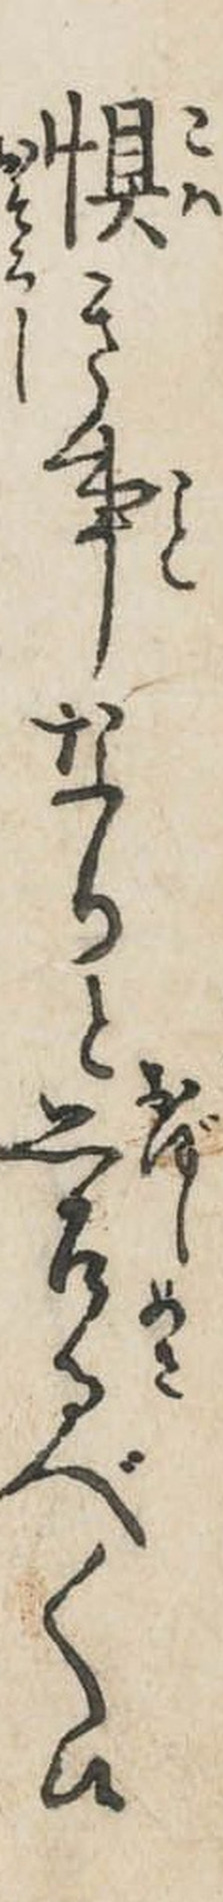惧き事なりと思召るべく候
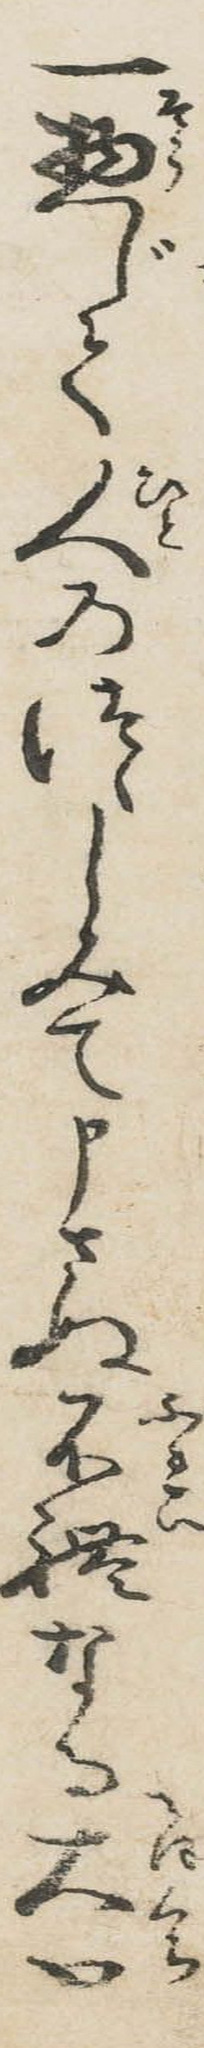一惣じて人のつゝしみて申さぬ不礼なる大口
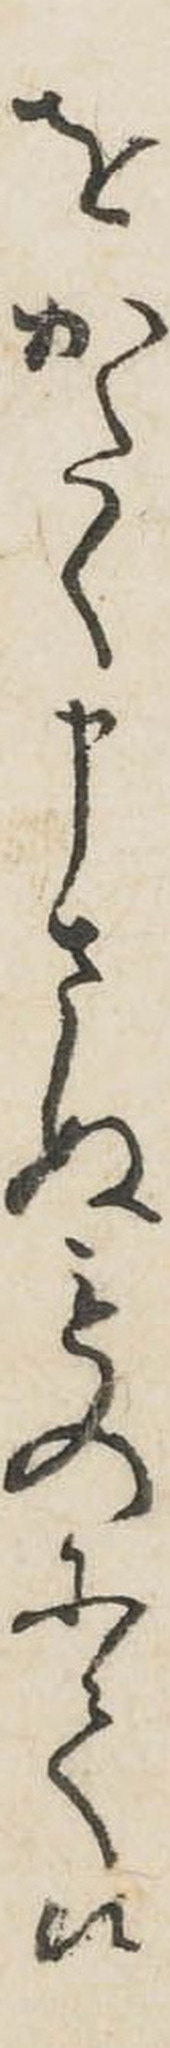をかたく申さぬものにて候
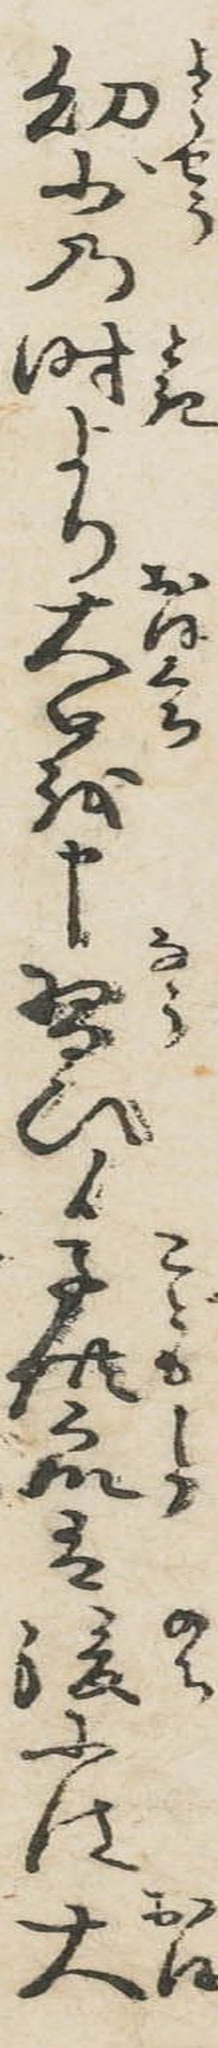幼少の時より大口を申習ひ候子供衆は後には大
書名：前訓
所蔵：東京学芸大学附属図書館
